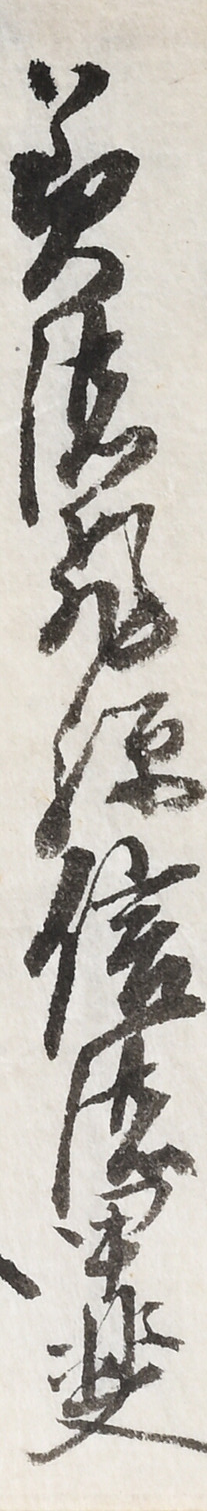美濃飛騨信濃甲斐
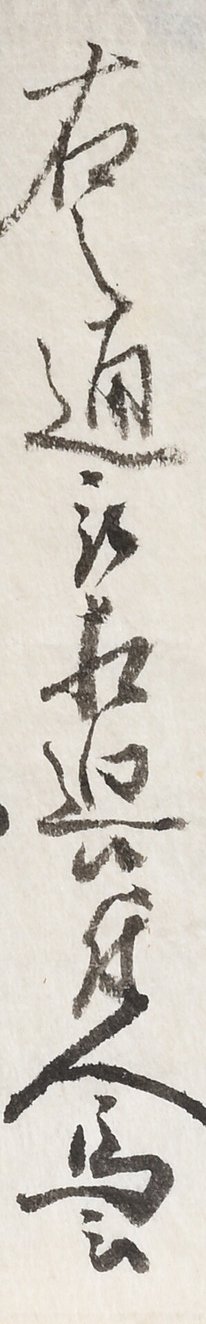右之通被相廻候ニ付人馬被
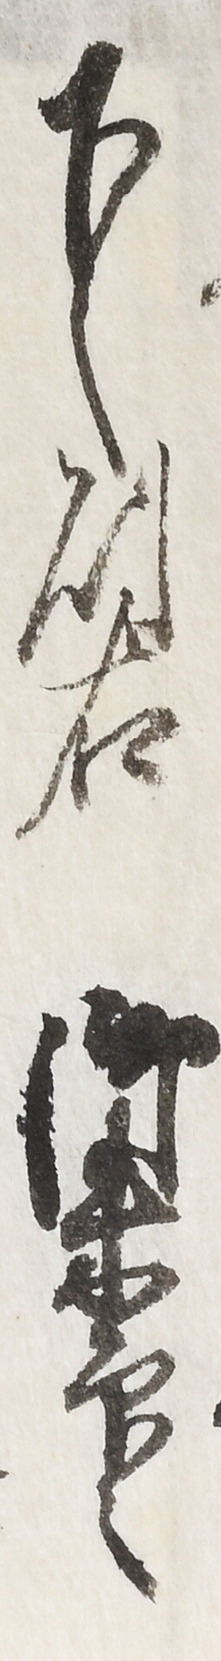下候則右御朱印之
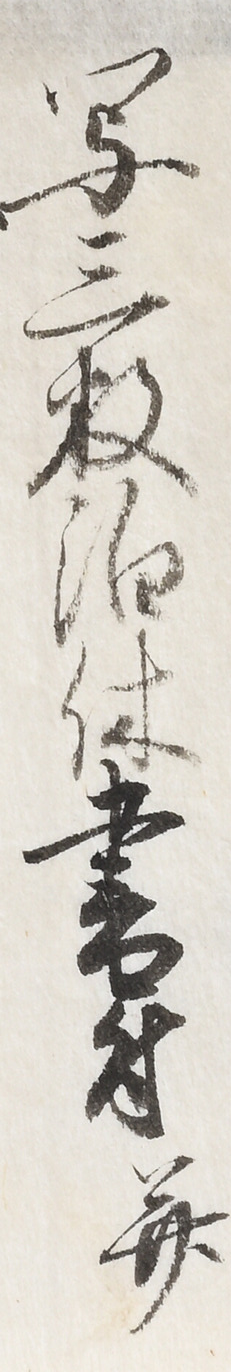写三枚泊休書付幷
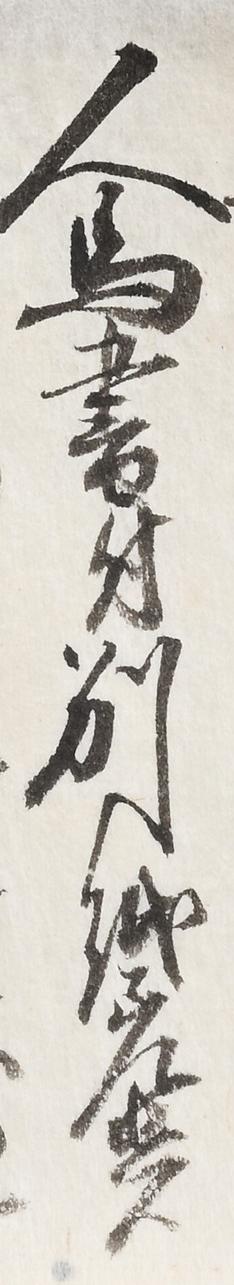人馬書付別紙差出人
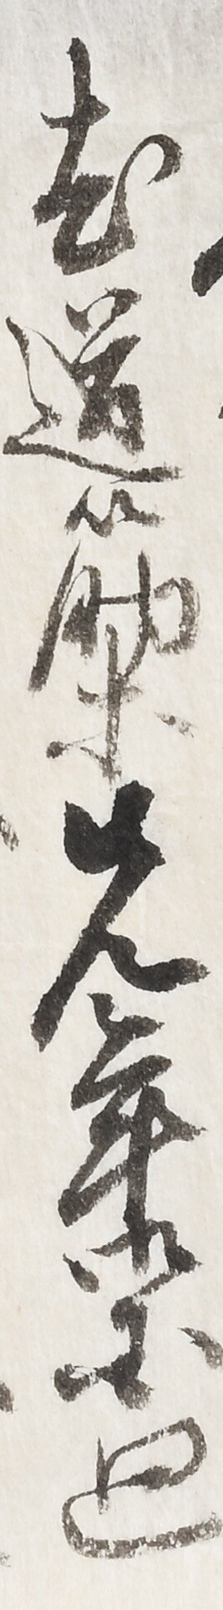尤道筋等先年御国廻
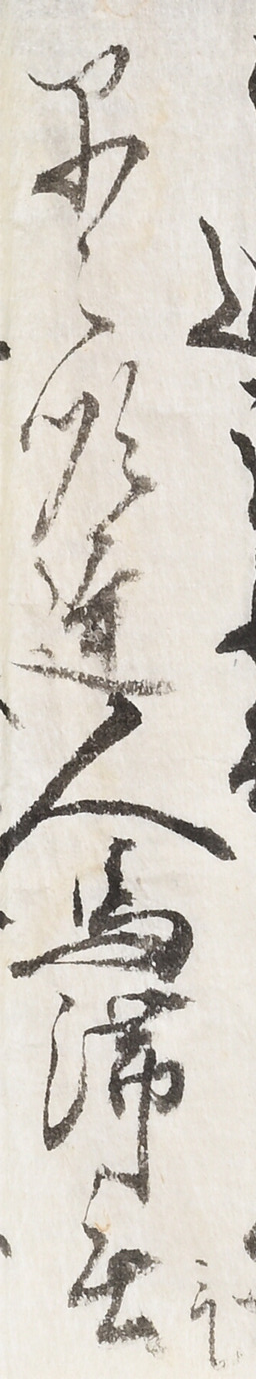早々順達人馬滞無
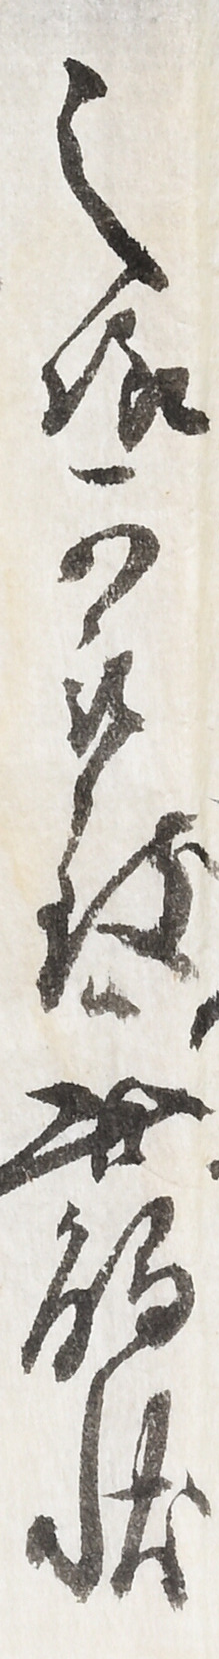之様可被致候此触状
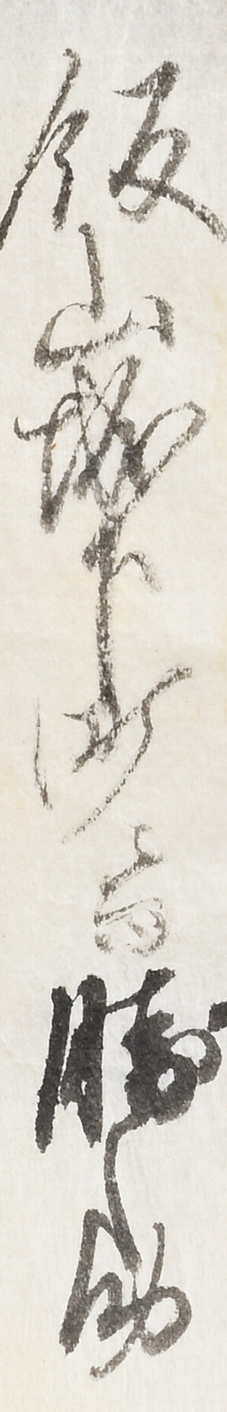飯山城下町ニ而勝之助
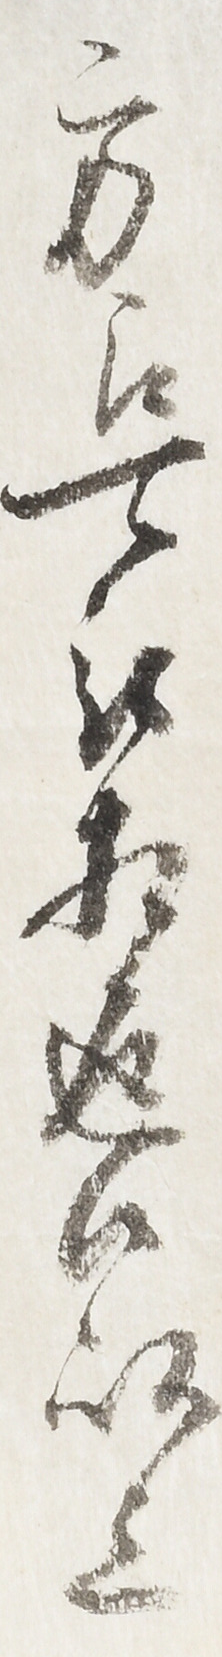方え可被相返候以上
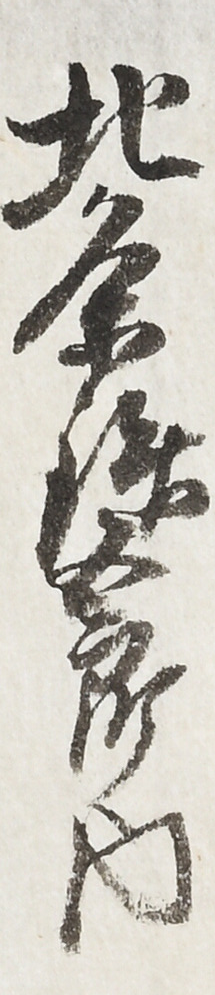北条鉄五郎内
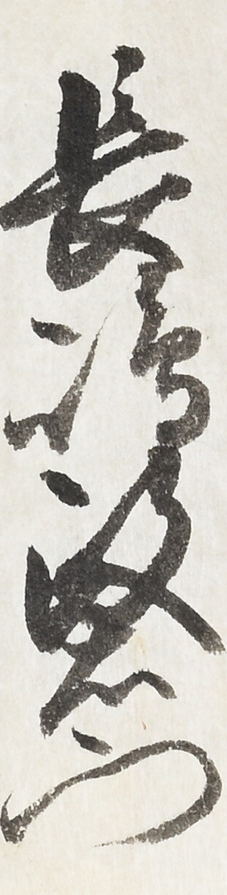長島政右衛門
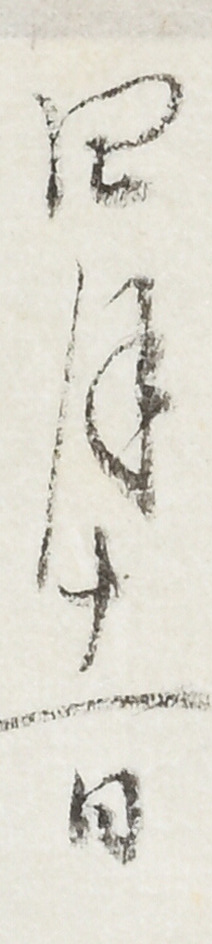四月十一日

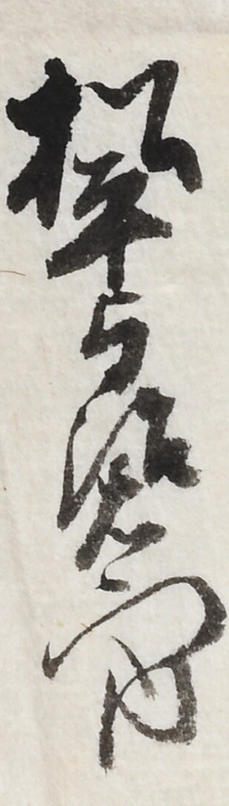松平与治右衛門内
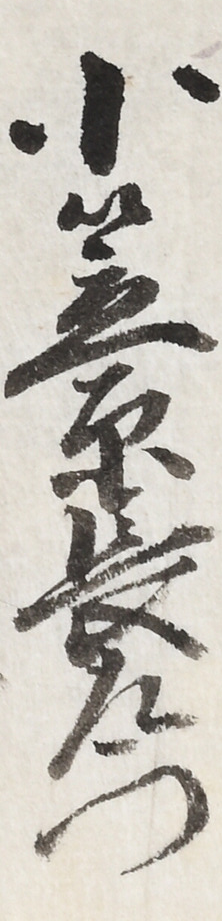小笠原長左衛門
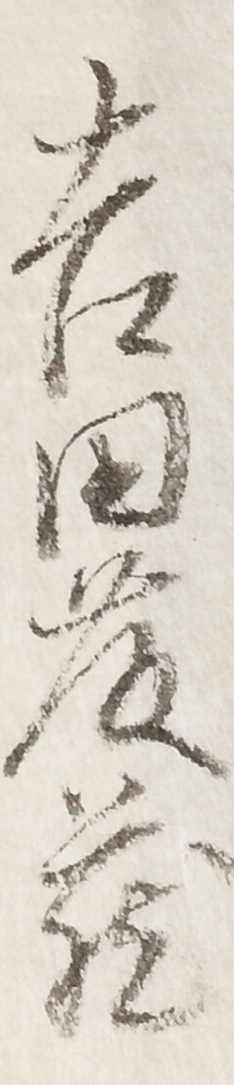吉田藤蔵
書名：御巡見様御先觸之写
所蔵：伊那市立高遠町図書館・合同会社AMANE
